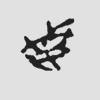妻
